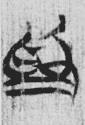爲
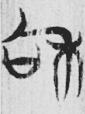和
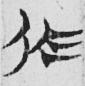於
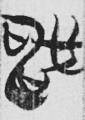○（陳）
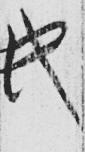女（如）
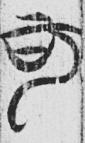可（何）
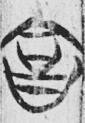合
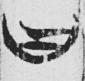曰
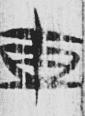車
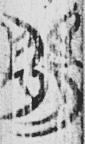○（閒）
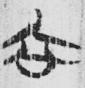容
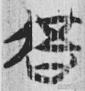俉俉
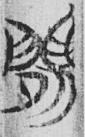{門夕刀}（間）
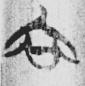容
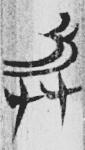兵
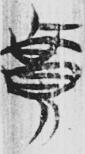貴
